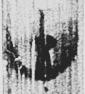山
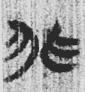非
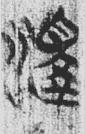澤
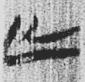亡
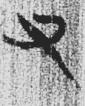又（有）
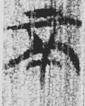不
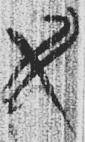民
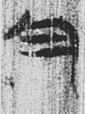今
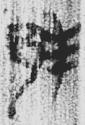邦
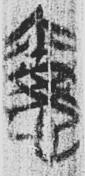○（彌）
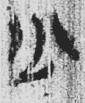小
